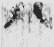八
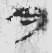月
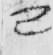己
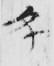丑
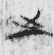之
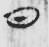日
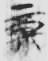福
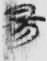昜（陽）
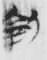○（宰）
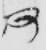尹
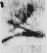之
